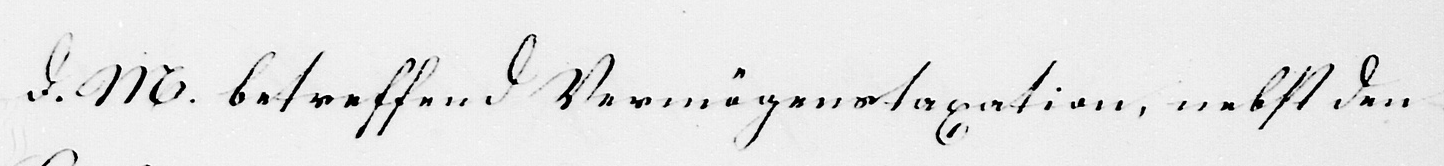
d. M. betreffend Vermögenstaxation, nebst den
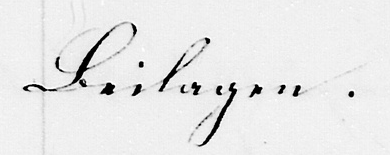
Beilagen.
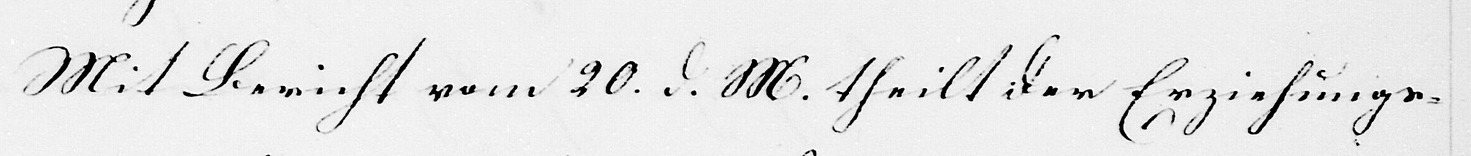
Mit Bericht vom 20. d. M. theilt der Erziehungs¬
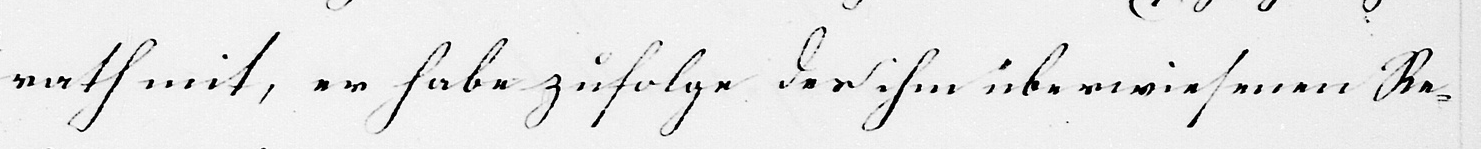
rath mit, er habe zufolge des ihm überwiesenen Re¬
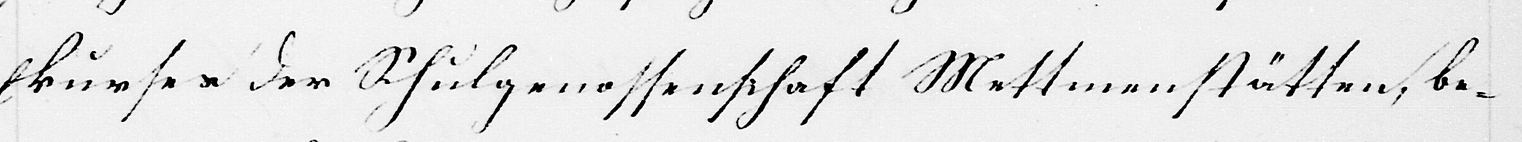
kurses der Schulgenossenschaft Mettmenstätten [si¬
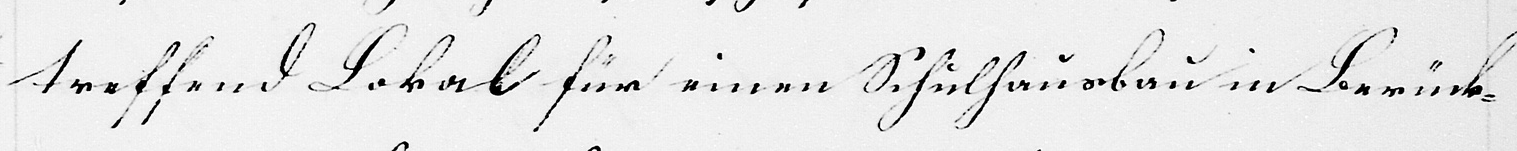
treffend Lokal für einen Schulhausbau in Berück¬
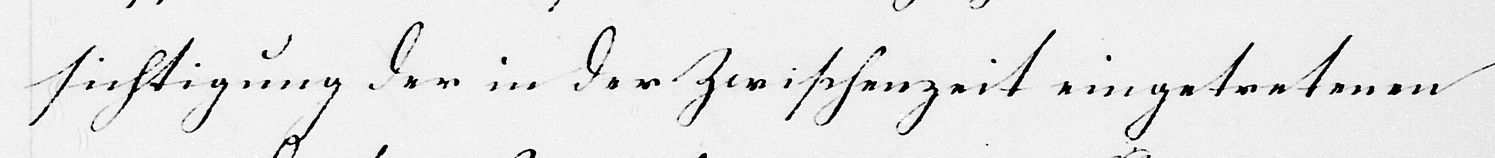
sichtigung der in der Zwischenzeit eingetretenen
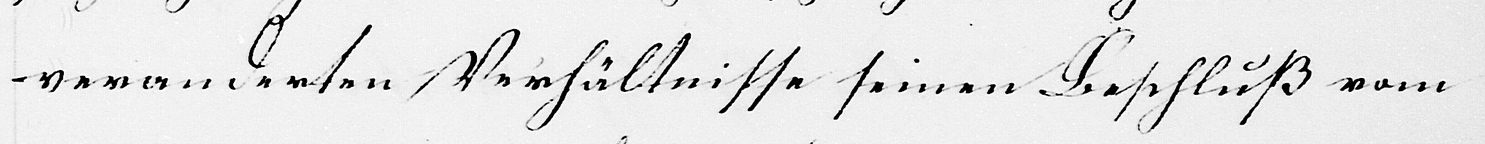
veranderten Verhältnisse seinen Beschluß vom
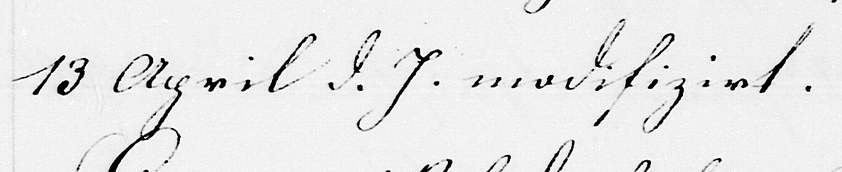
13 April d. J. modifizirt.
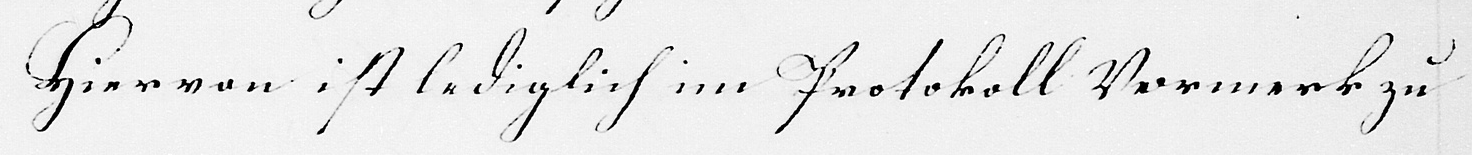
Hiervon ist lediglich im Protokoll Vermerk zu
